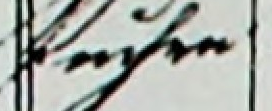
Puchen
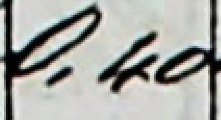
0,40
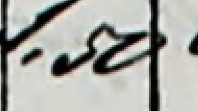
1,50
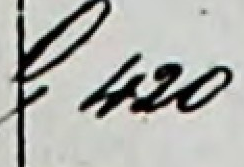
0,420
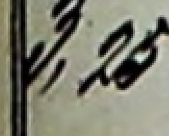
3,25
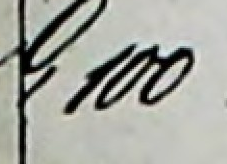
0,100
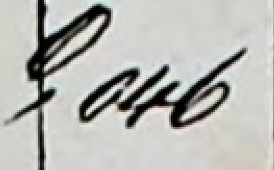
0,046
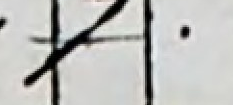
7
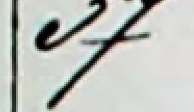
37
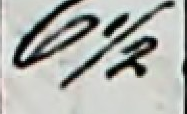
6 1/2
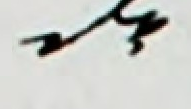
Do
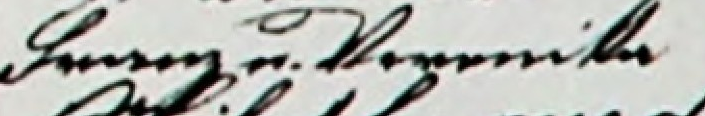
Franz u. Veronika
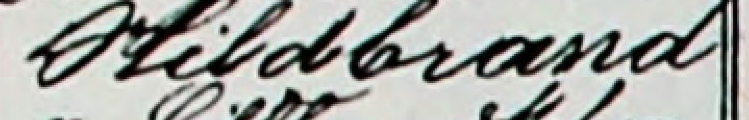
Hildbrand
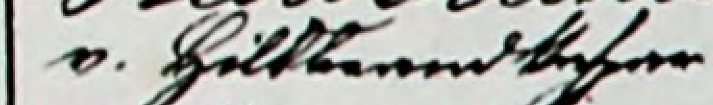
v. Hildbrand
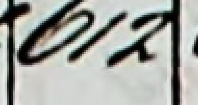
612
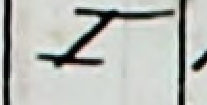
I
